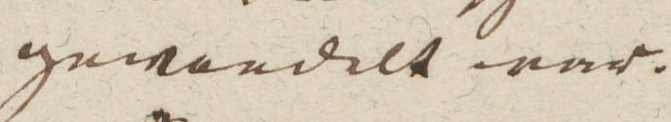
gewandelt war.
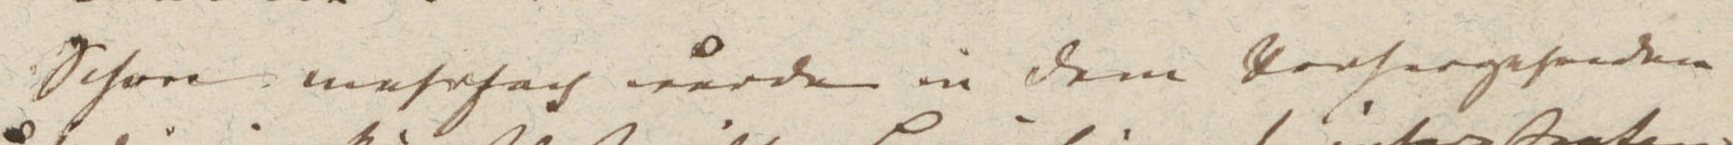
Schon mehrfach wurde in dem Vorhergehenden
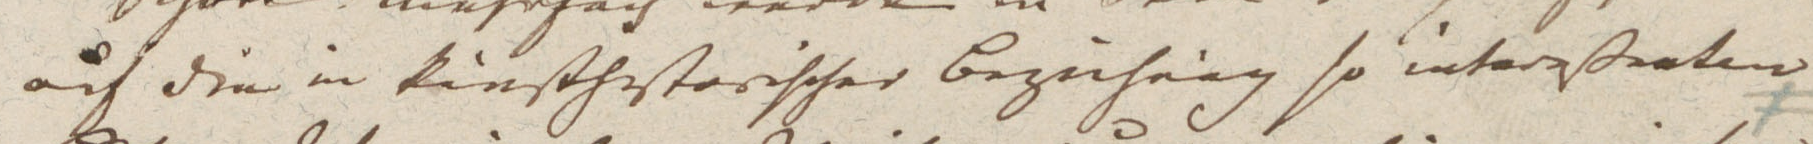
auf die in kunsthistorischer Beziehung so interessanten
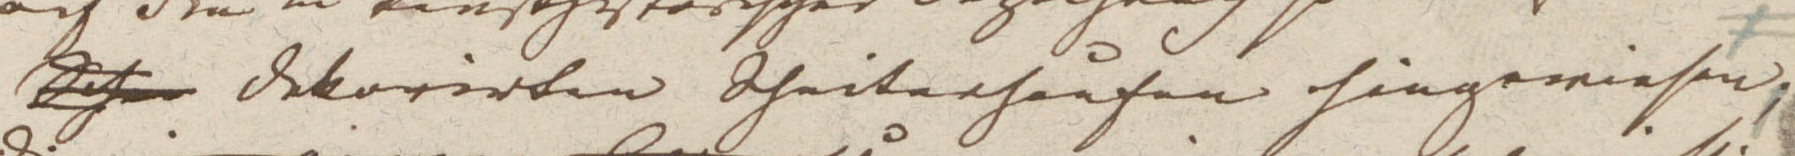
Sch dekorirten Scheiterhaufen hingewiesen;, %
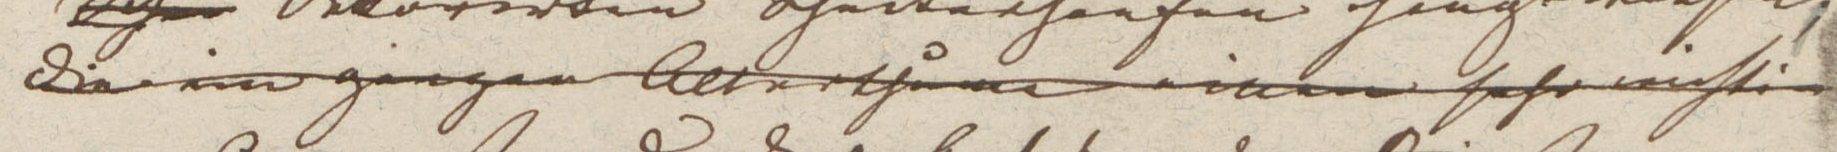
die im ganzen Alterthume einen sehr wichti-
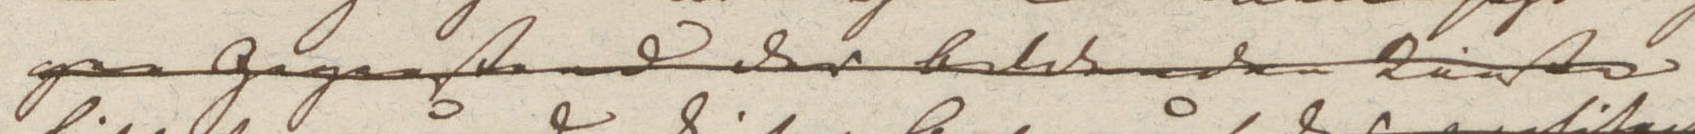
gen Gegenstand der bildenden Künste
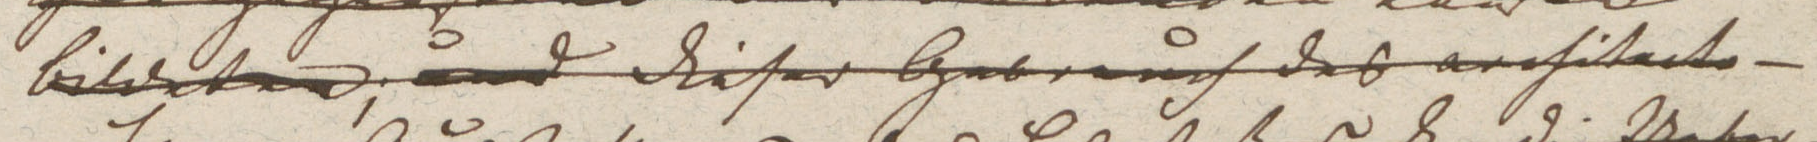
bildeten; und dieser Gebrauch des architecto-
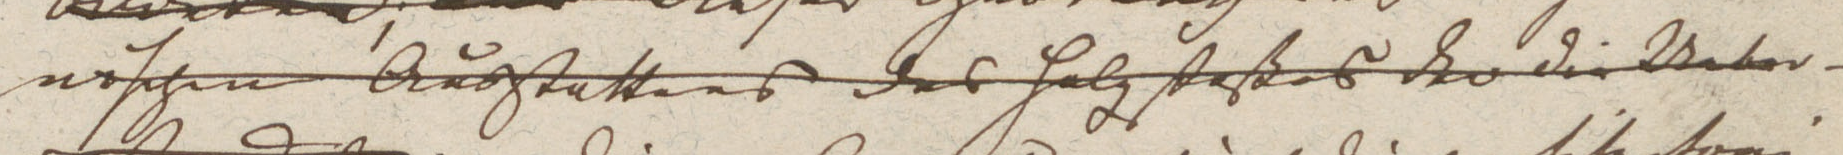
nischen Ausstattens des Holzstosses der die Ueber-
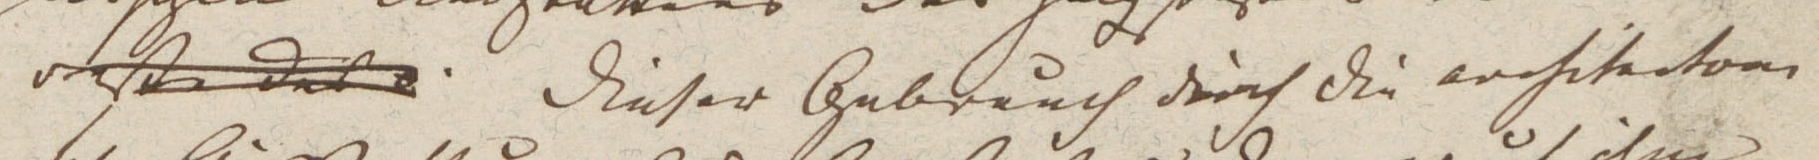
reste des Dieser Gebrauch durch die architectoni
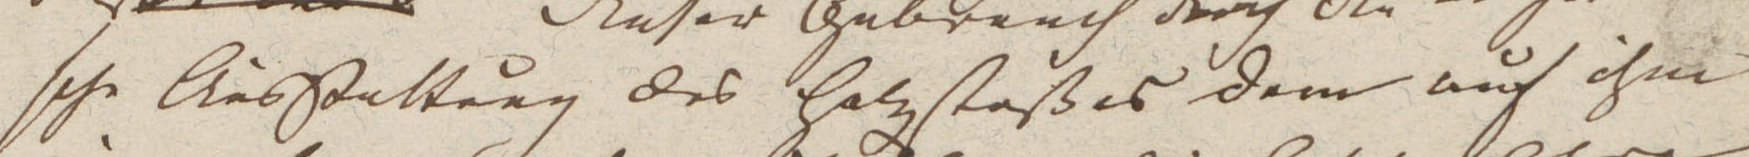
sche Ausstattung des Holzstosses dem auf ihm
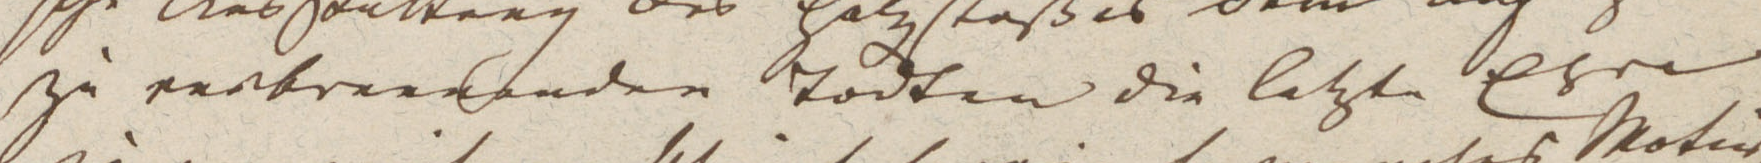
zu verbrennenden Todten die letzte Ehre
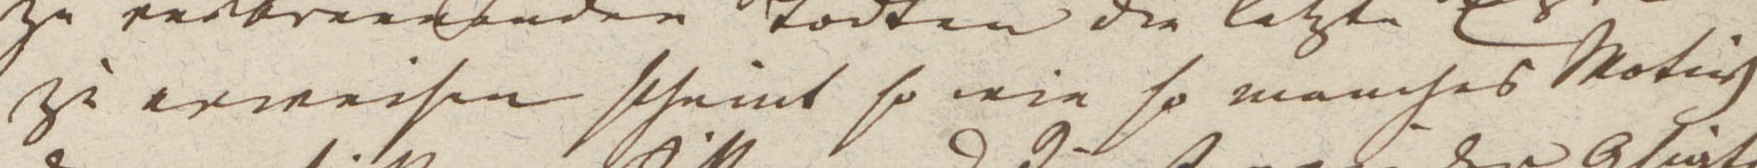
zu erweisen scheint so wie so manches Motiv
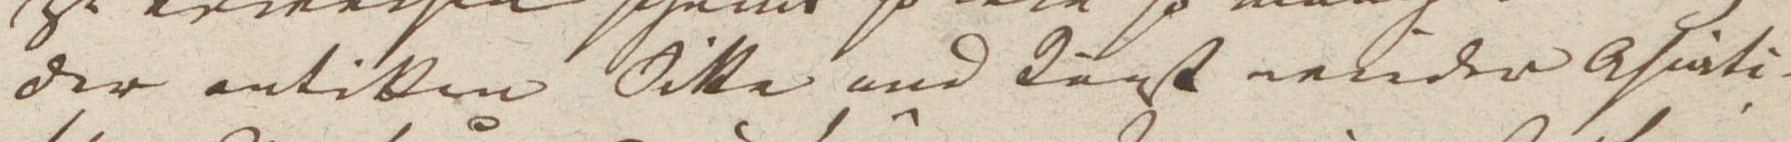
der antiken Sitte und Kunst wieder Asiati-
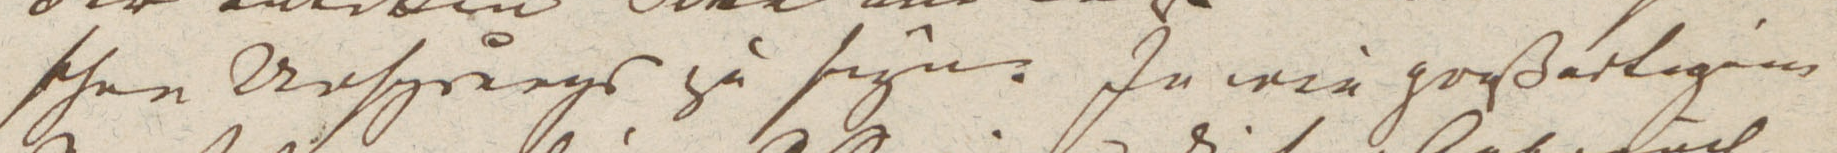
schen Ursprungs zu seyn. In wie grossartigem
